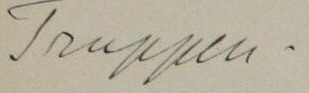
Truppen-
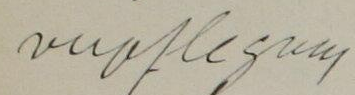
verpflegung
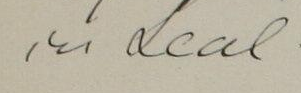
in Leal
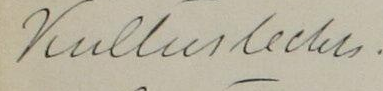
Kulturtechn.
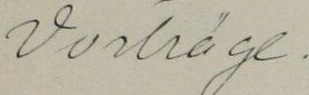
Vorträge
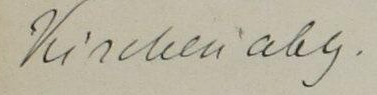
Kirchenabg.
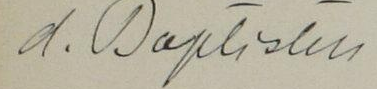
d. Baptisten
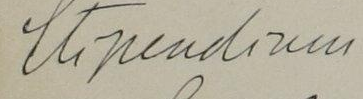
Stipendium
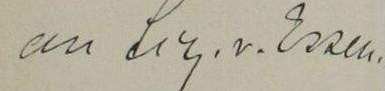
an Sig. v. Essen
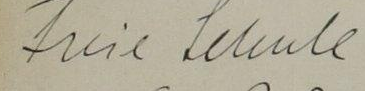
Freie Schule
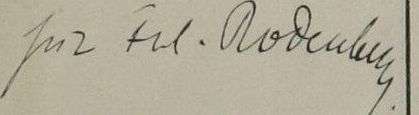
für Frl. Rodenberg
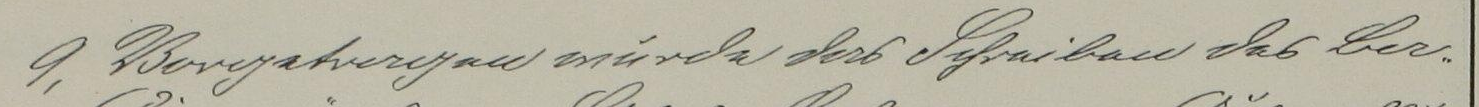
9. Vorgetragen wurde das Schreiben des Ba-
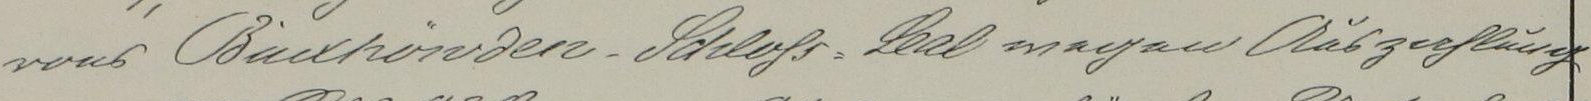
rons Buxhöwden-Schloss-Leal wegen Auszahlung
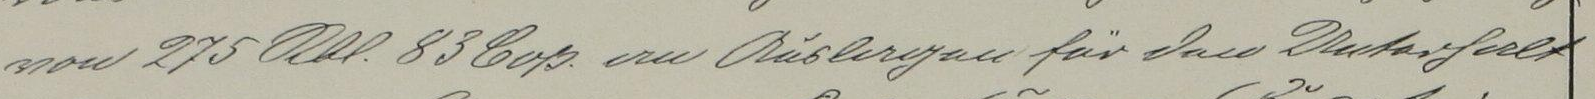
von 275 Rbl. 83 Cop. an Auslagen für den Unterhalt
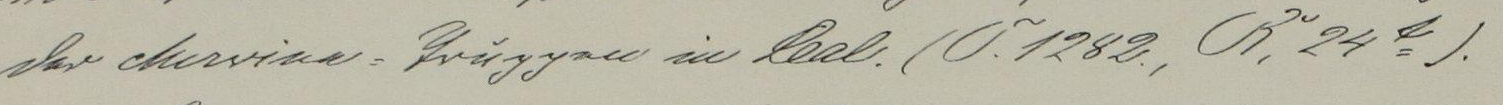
der Marine-Truppen in Leal. (T.1282; R.24t).
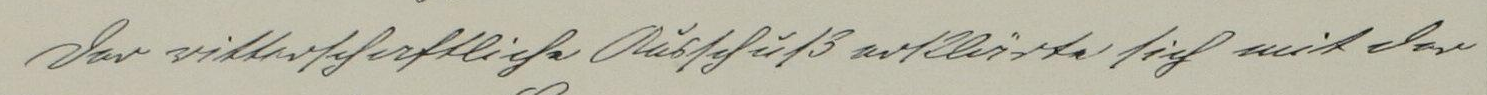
Der ritterschaftliche Ausschuß erklärte sich mit der
